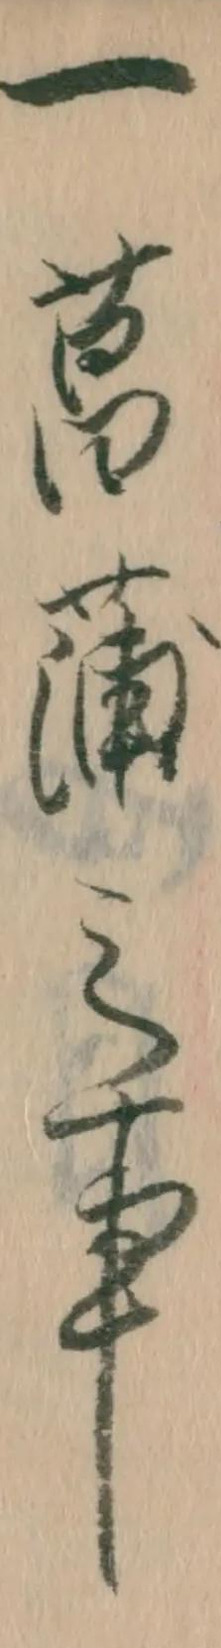一菖蒲之事
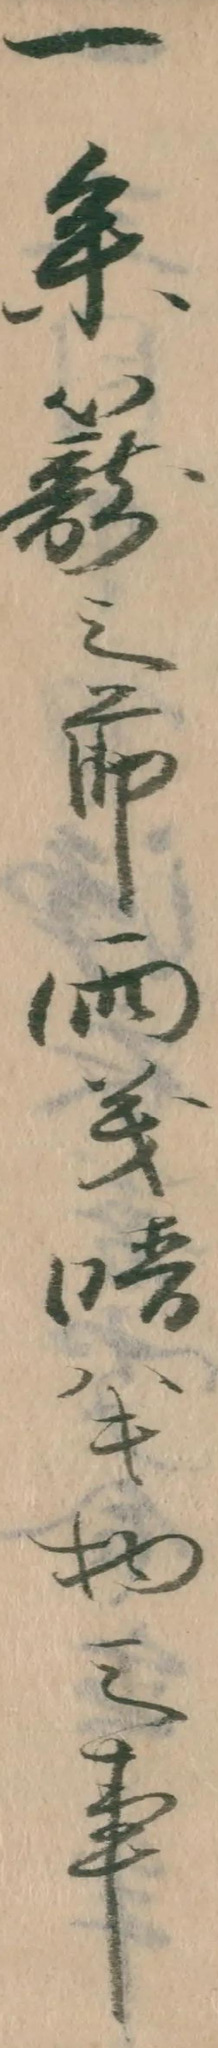一参籠之節雨義晴ハキ物之事
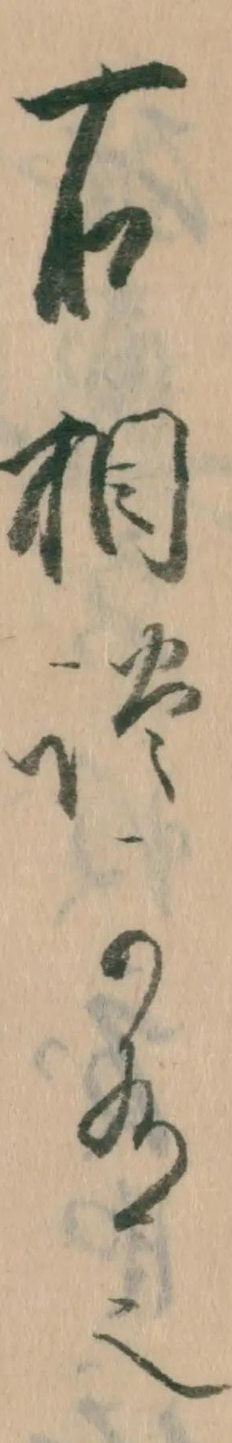右相談可有之
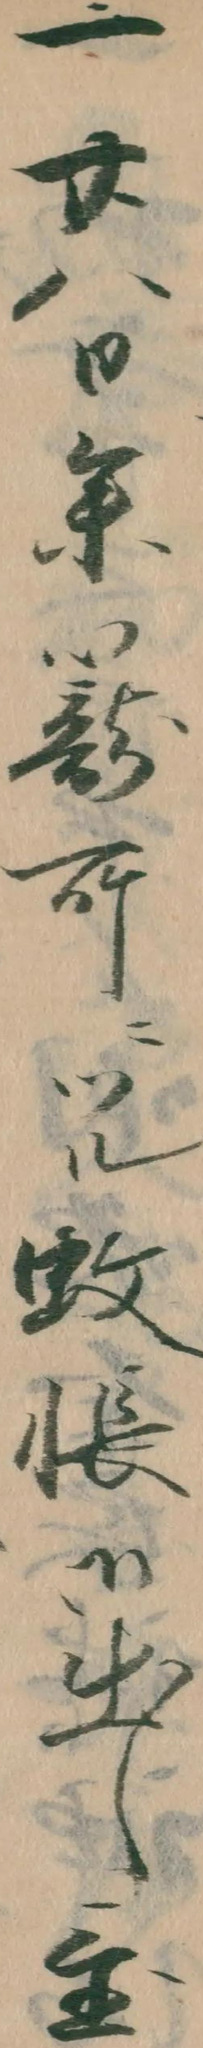一廿八日参籠所ニツル蚊帳御出候置
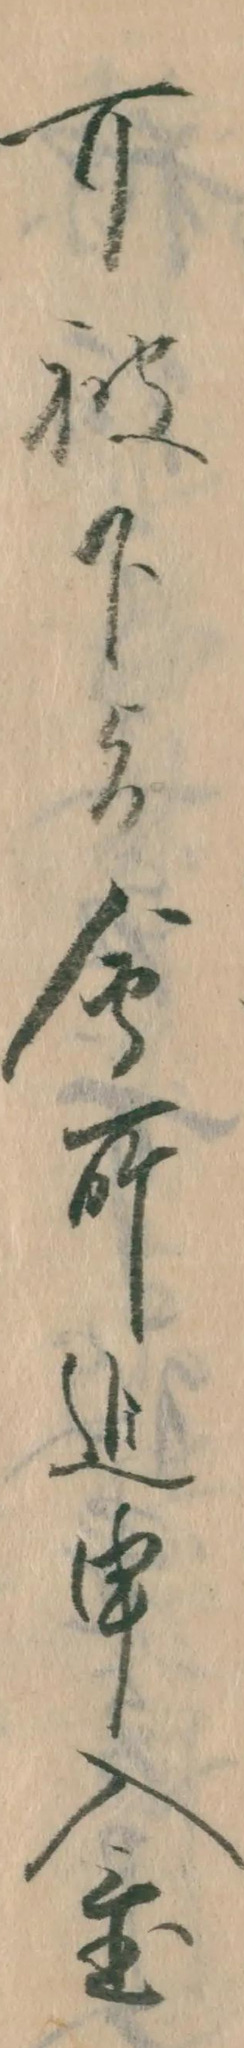可被下旨會所迄申入置
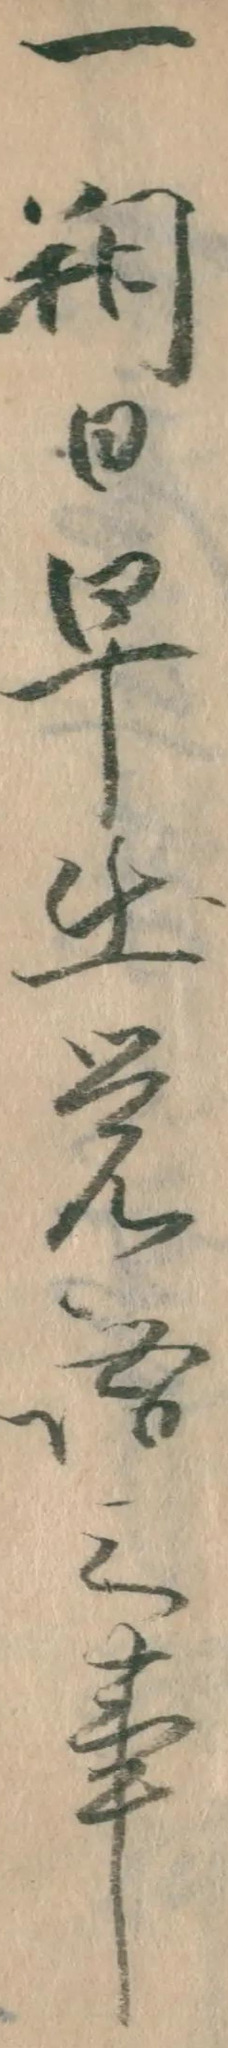一朔日早出覚語之事
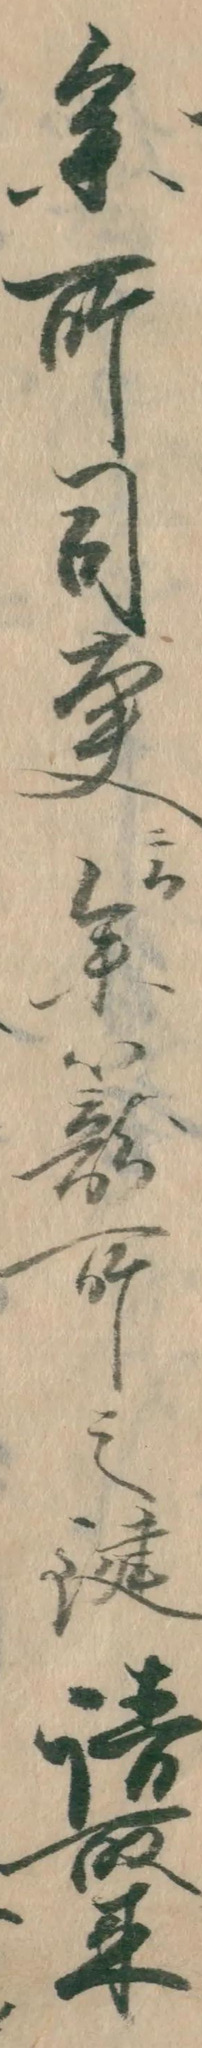参所司大夫に而参籠所之鍵請取来
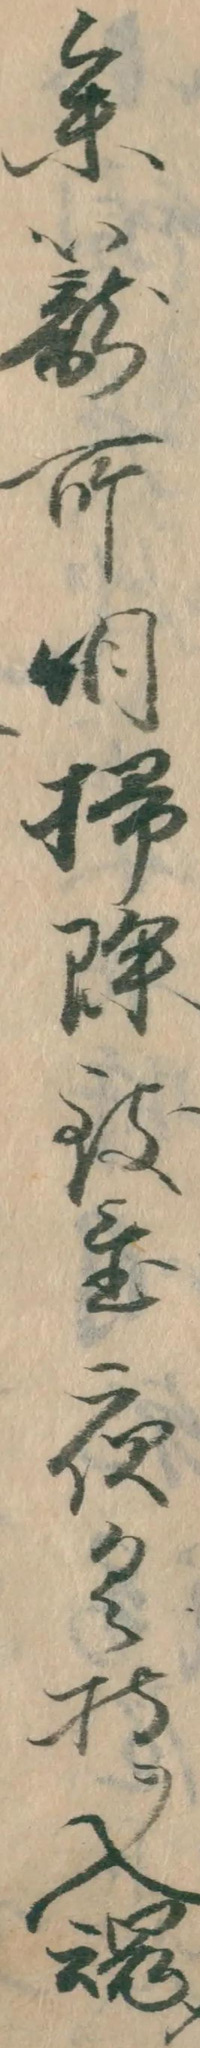参籠所月掃除致置夜具持ヲ入魂して
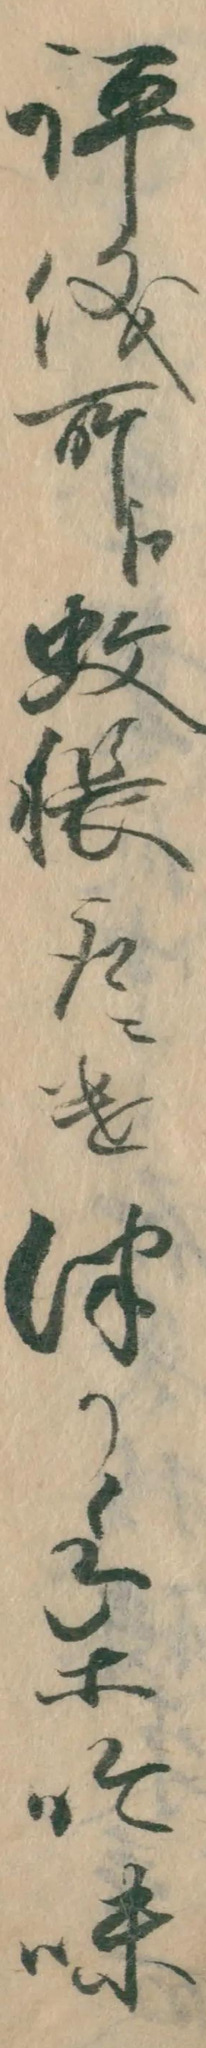評議所江蚊帳取ニ遣つかね等吟味

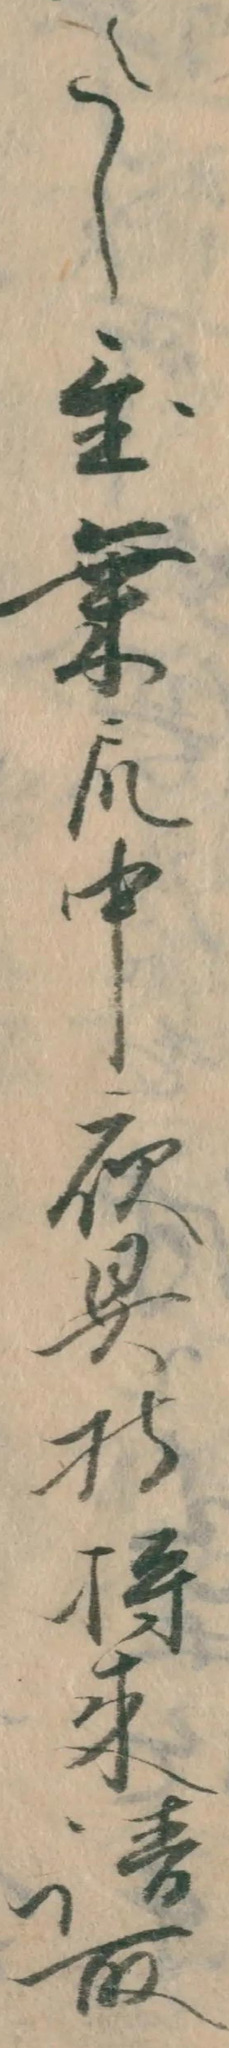いたし置乗衆中夜具持将来請取
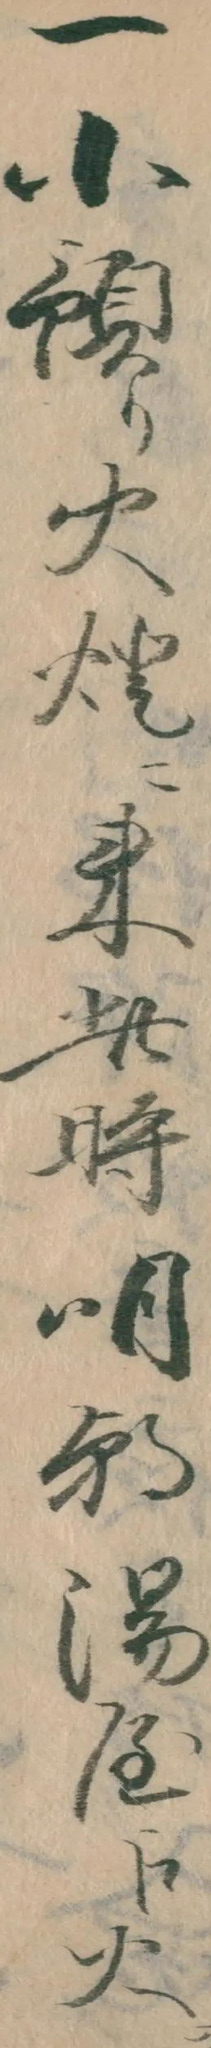一小預り火燈ニ来此時明朝湯屋江火ヲ
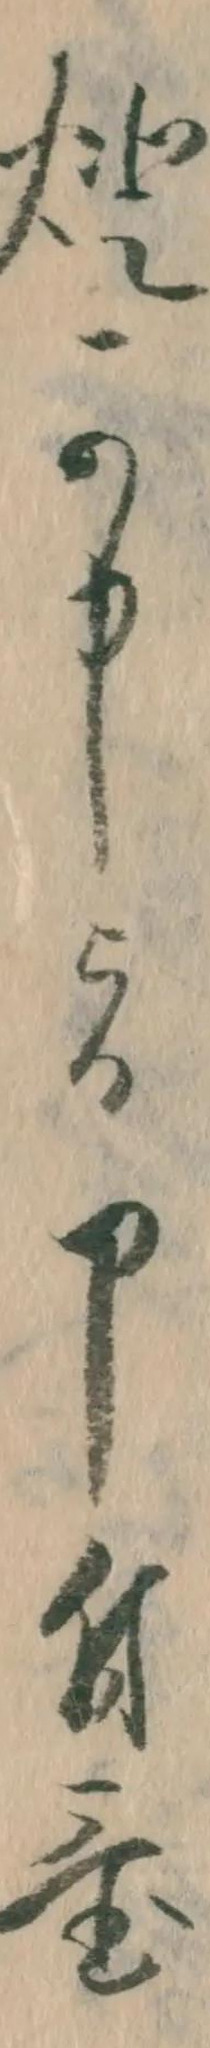燈可申旨申付置
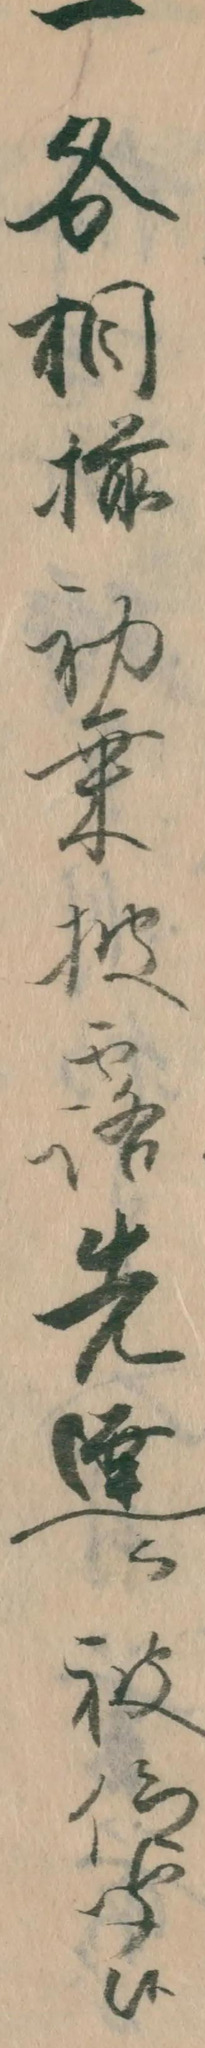一各相揃初乗披露先達而被仰聞候
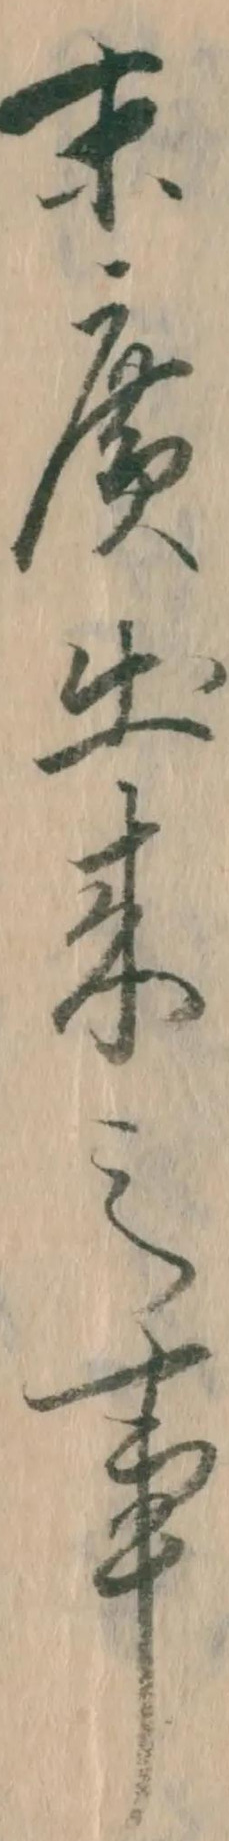末廣出来之事
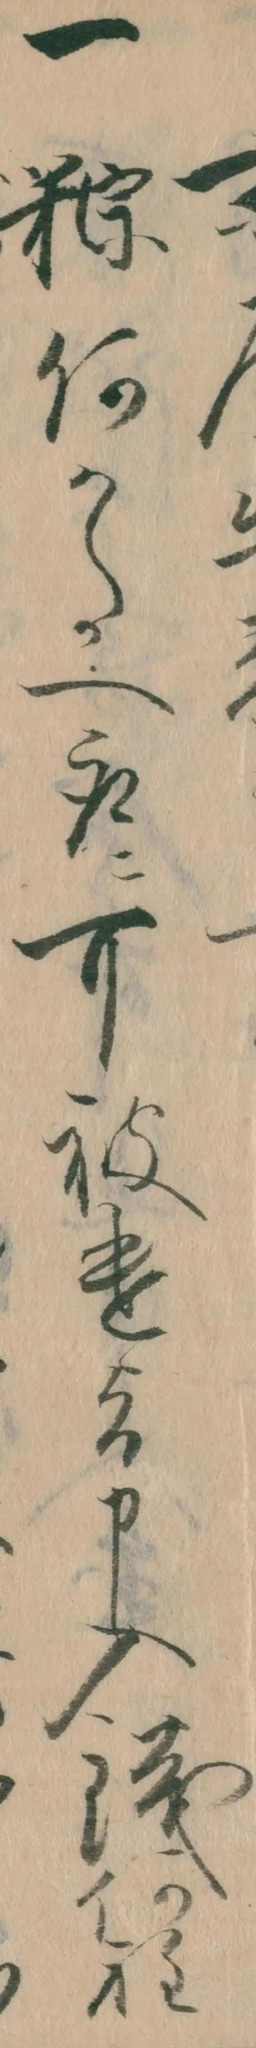一粽何かたへ取ニ可被遣旨申入銭何程
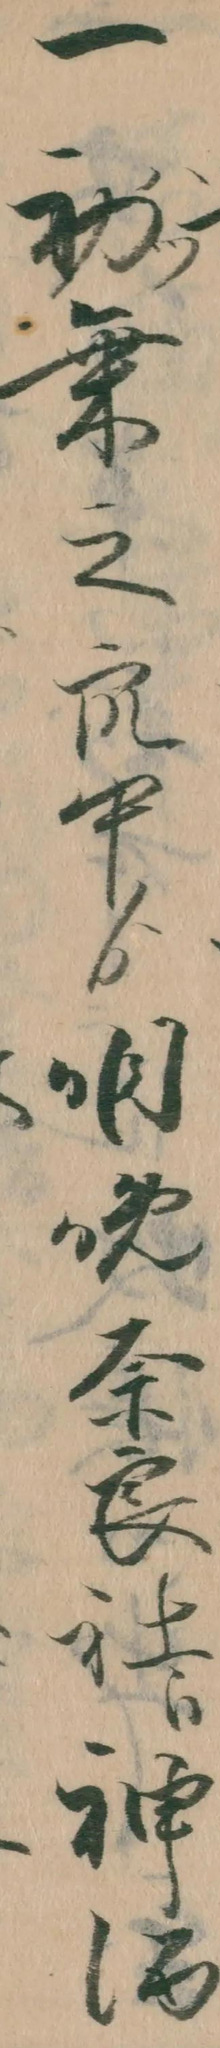一初乗之衆中ゟ明晩奈良社江神酒
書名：賀茂社記録. 第11冊
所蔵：国立国会図書館 National Diet Library, JAPAN
